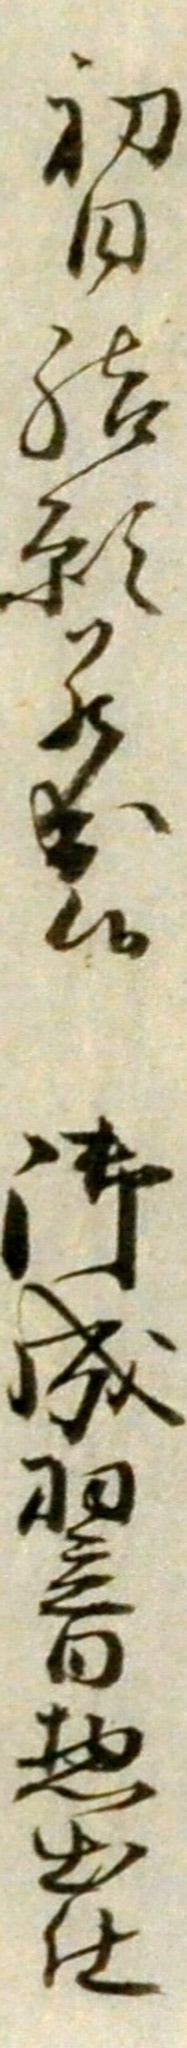初日結願罷出候御成翌日惣出仕
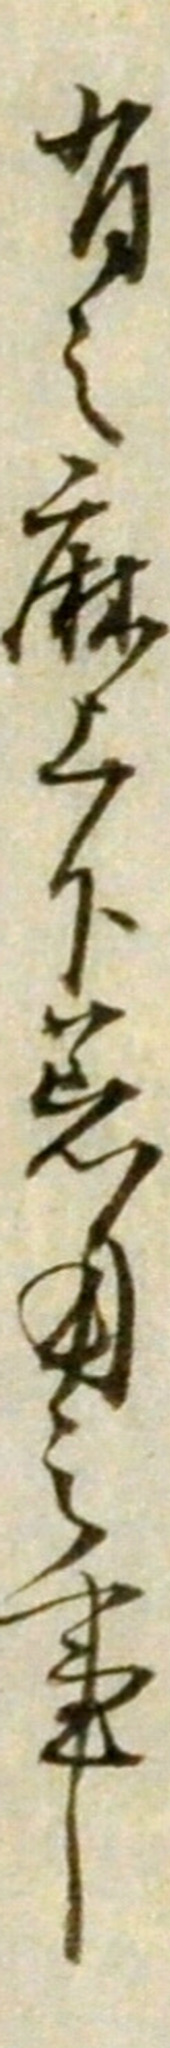有之麻上下着用之事
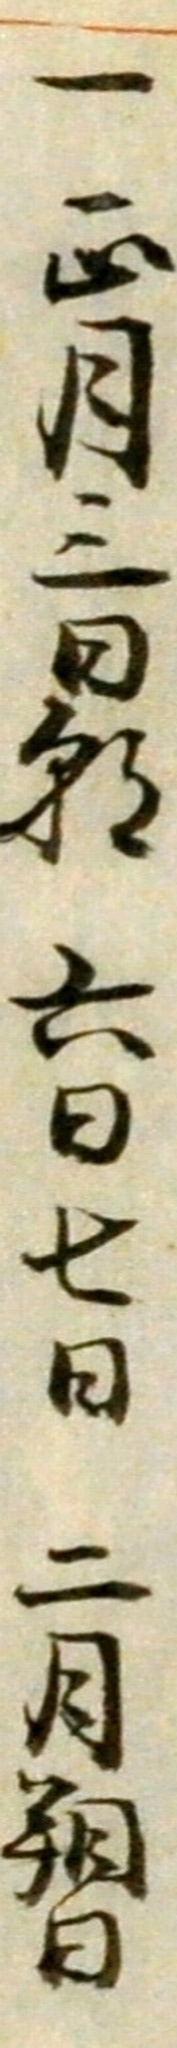一正月三日朝六日七日二月朔日
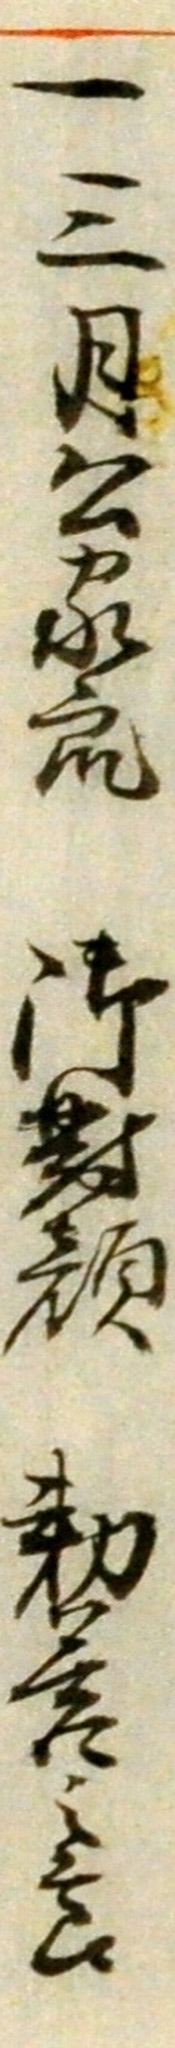一三月公家衆御対顔勅答之節
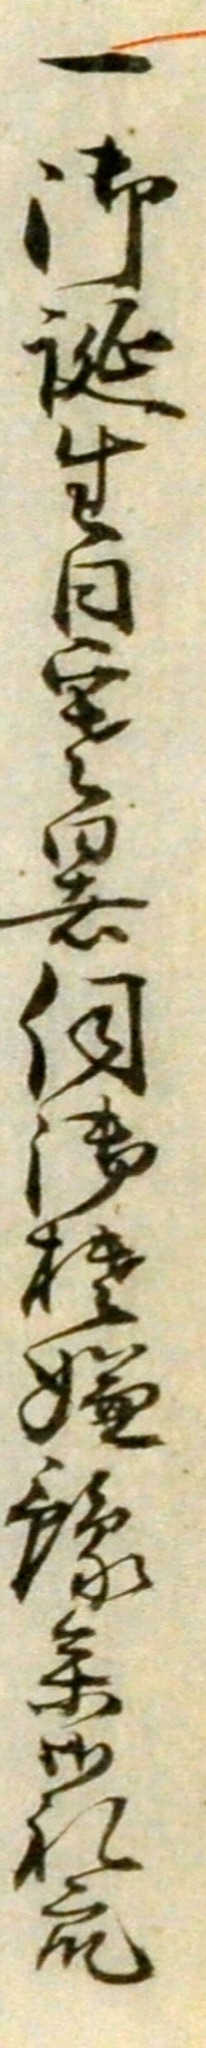一御誕生日寒暑伺御機嫌予参御礼衆
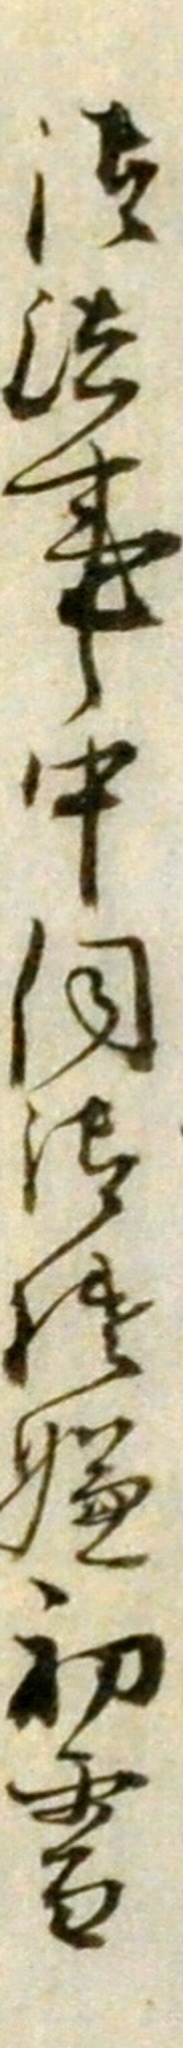御法事中伺御機嫌初雪
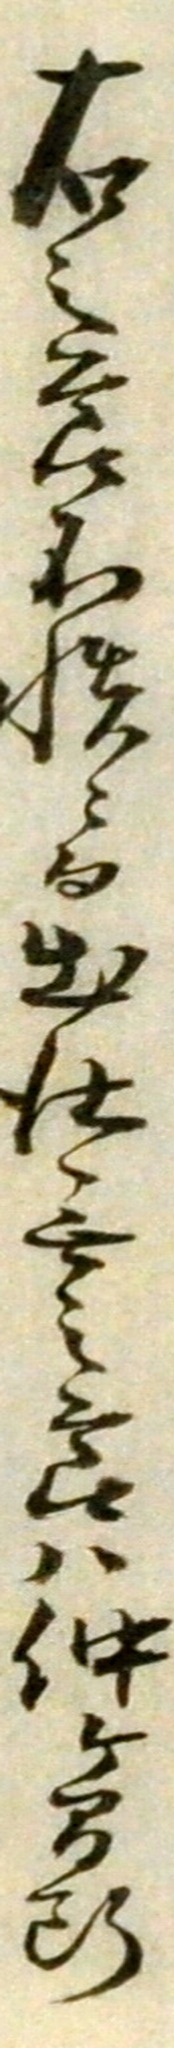右之節不快にて出仕無之節は仲ヶ間断
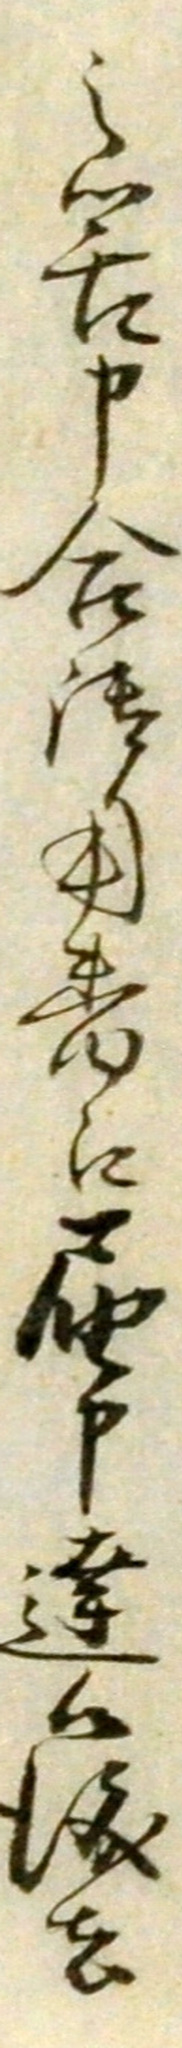之筈申合御用番え届申達候儀は
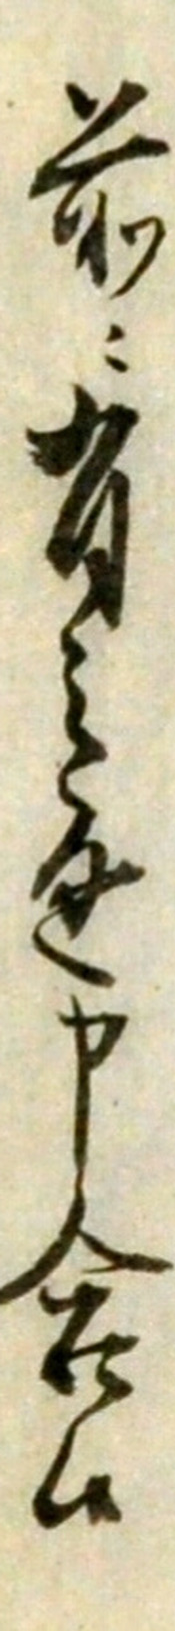前に有之通申合候
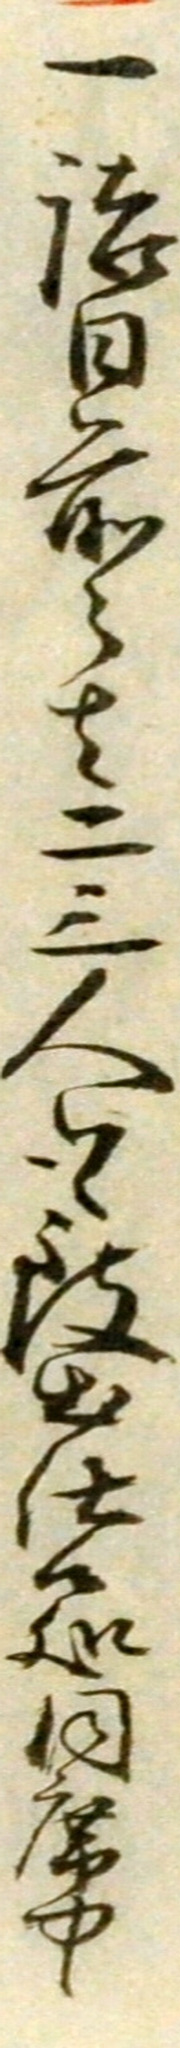一詰日前々はニ三人ツヽ致出仕候処同席中
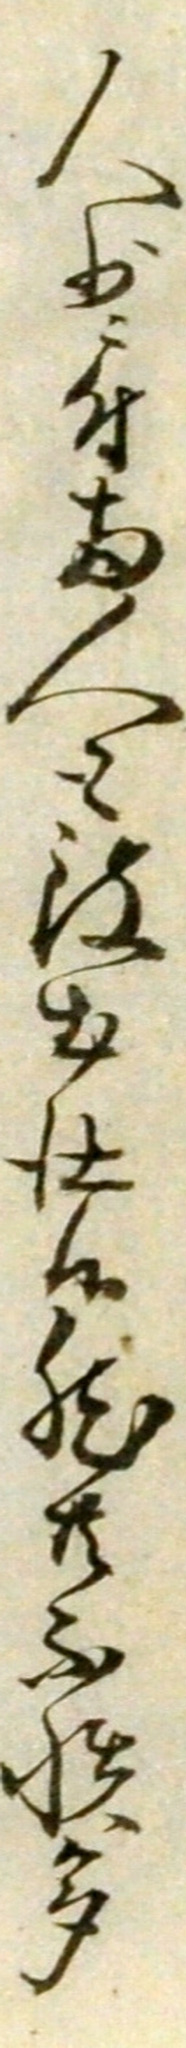人少に付両人ツヽ致出仕候然共不快多
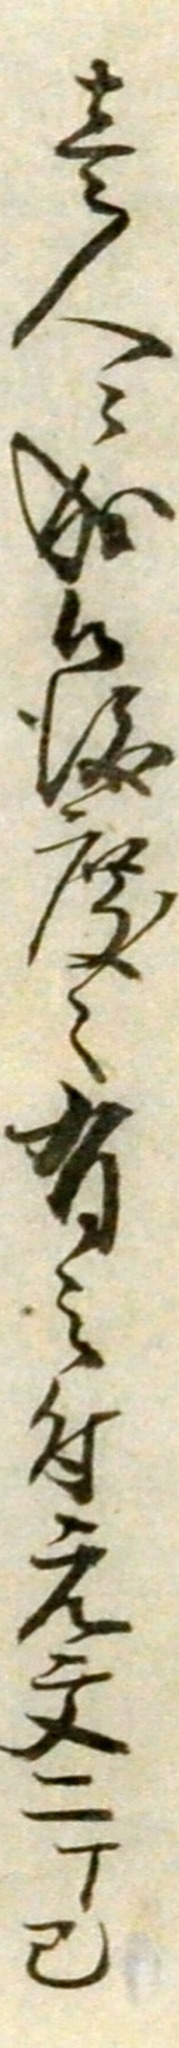壱人に成候儀度々有之付元文二丁巳
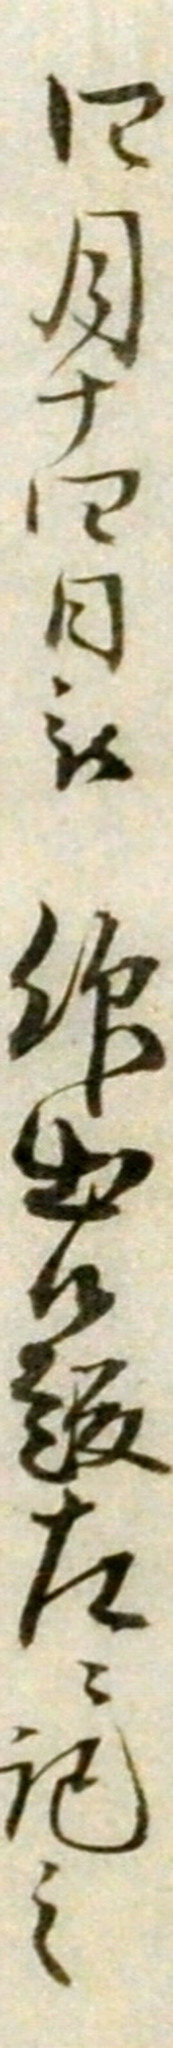四月十四日被仰出候趣左に記之

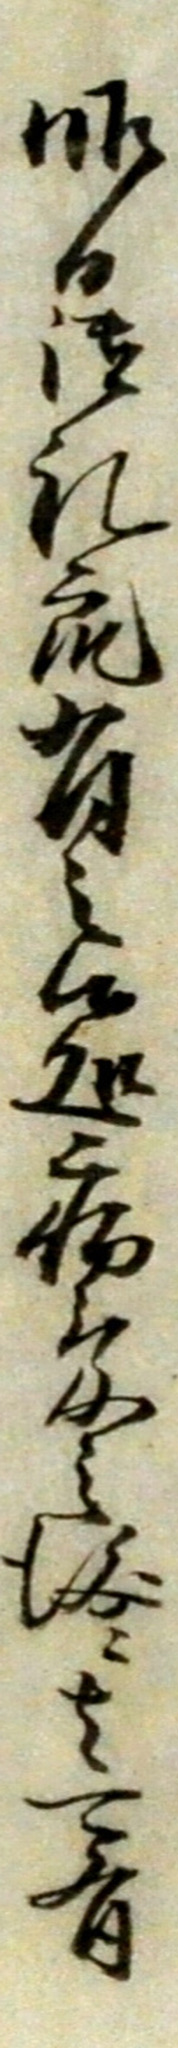昨日御礼衆有之候処病気之儀には可有
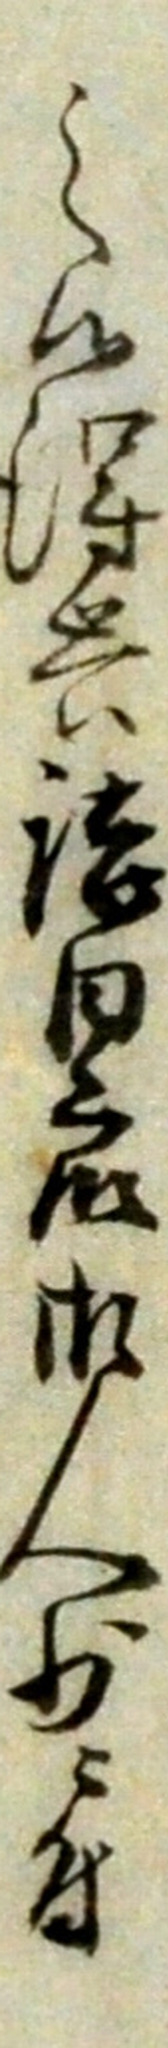之候得共詰日衆御人少に付
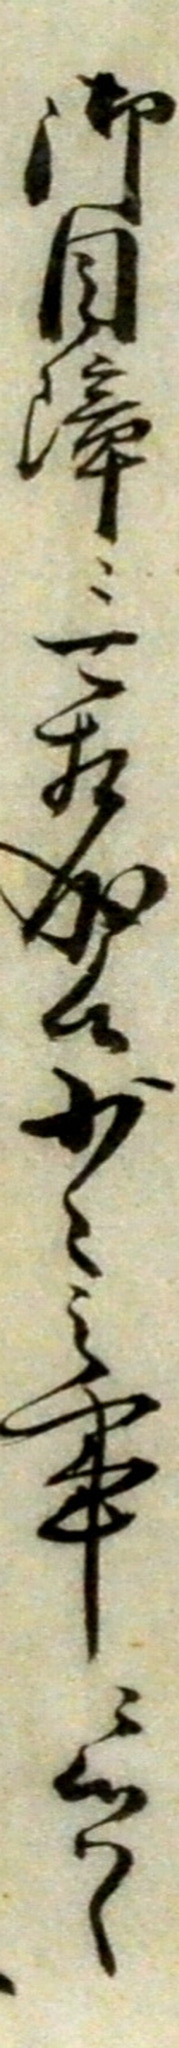御目障に可相成候少々之事に候はゝ
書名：申合帳〔一括〕
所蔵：伊那市立高遠町図書館・合同会社AMANE
